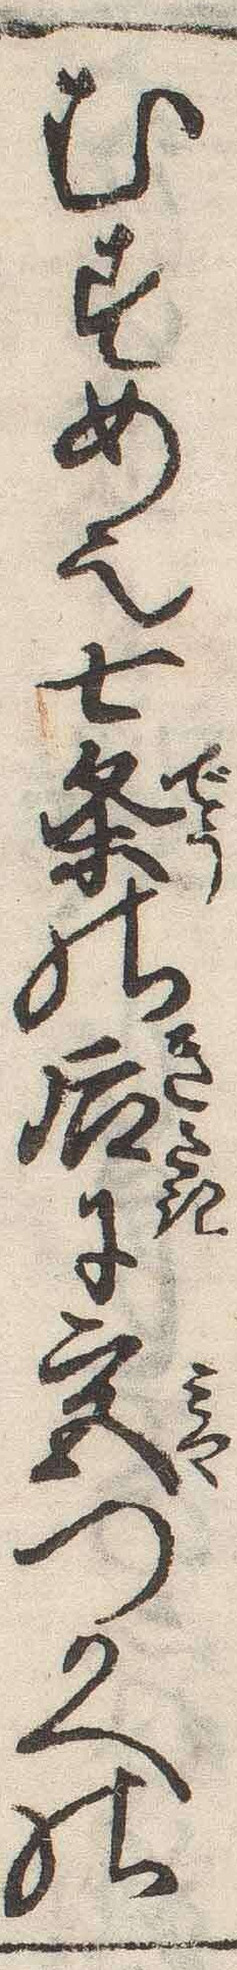むすめ也七条の后に宮つかへの
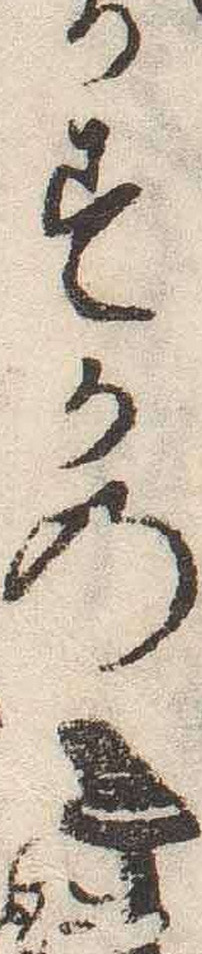かすかの
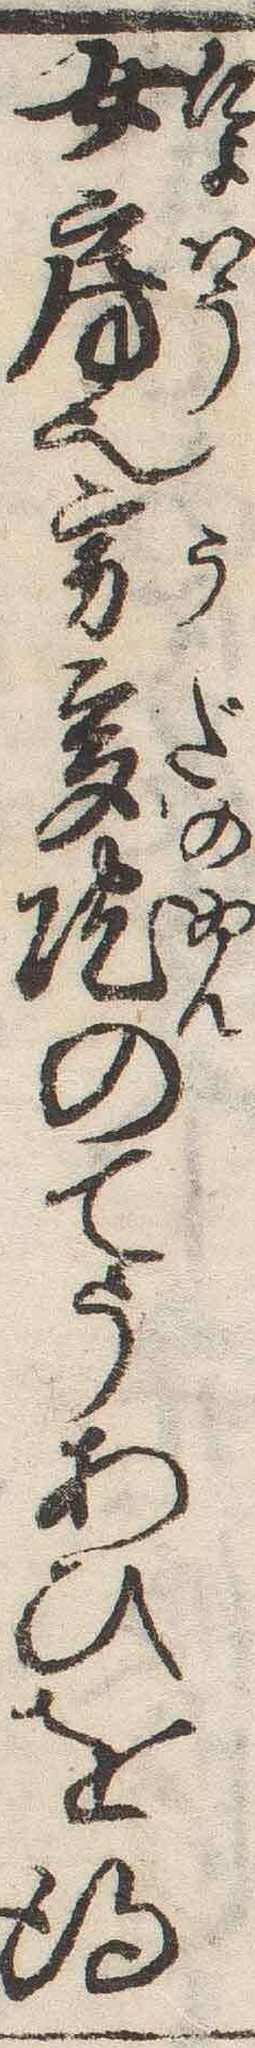女房也宇多院のてうあひを得
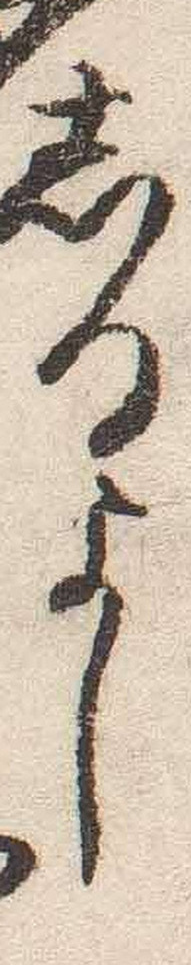しるよし
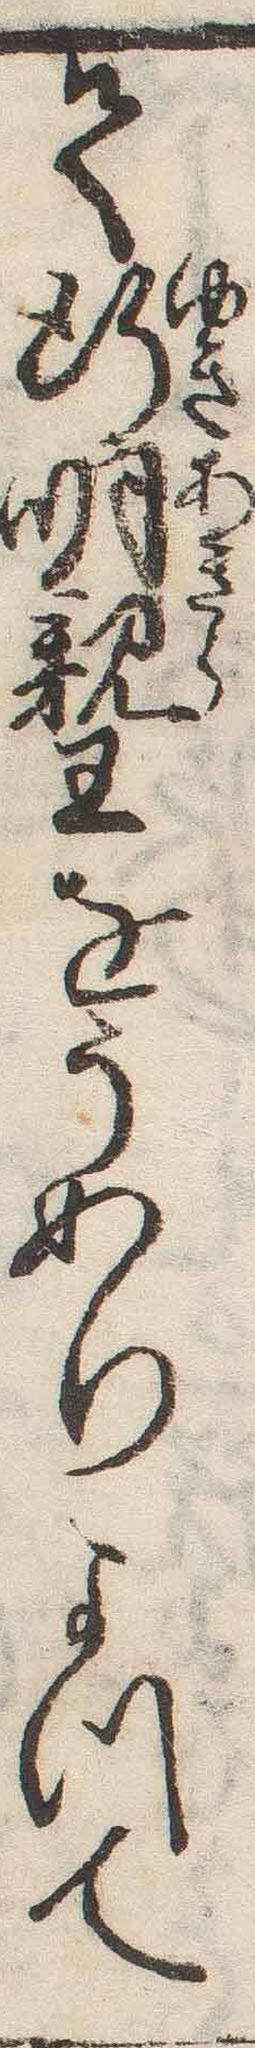て行明親王をうめりよつて
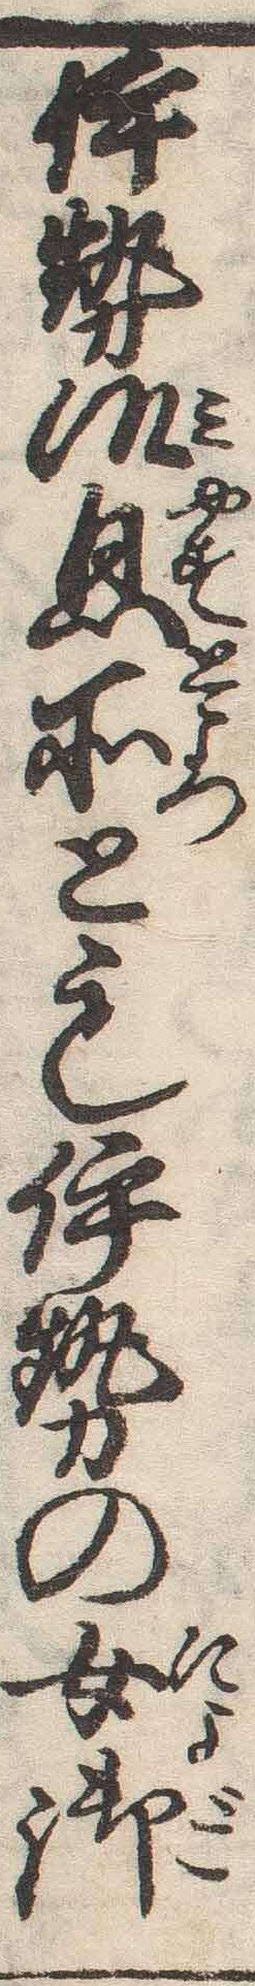伊勢御息所とも伊勢の女御
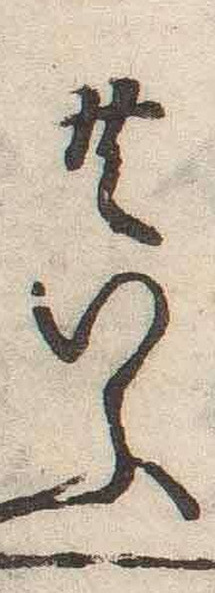共いふ

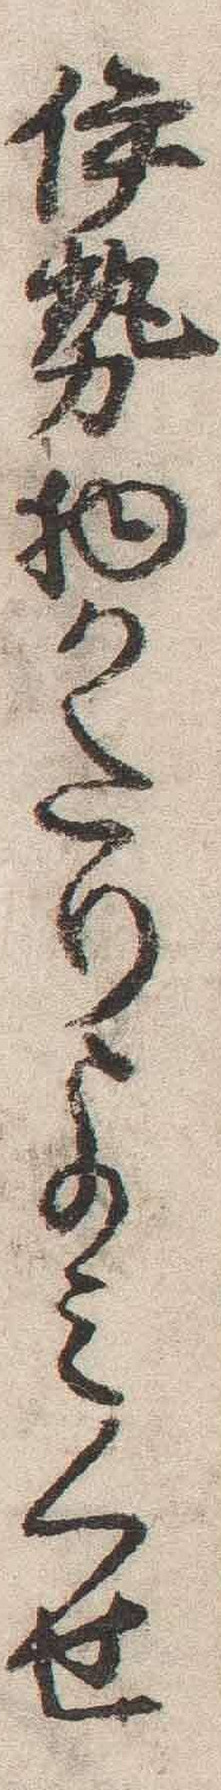伊勢物かたりよみくせ
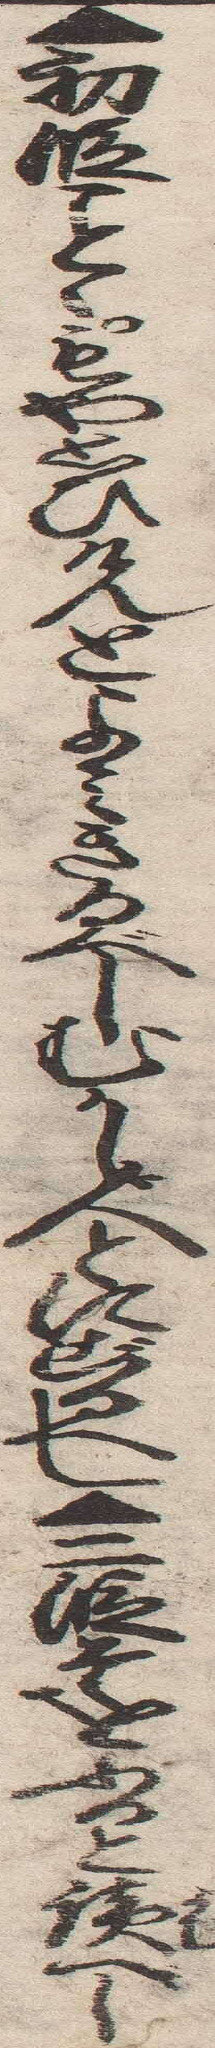▲初段ことゝ。もや思ひけんとよみきるべしむかし〝人とにごるへし▲二段そをふると読へし
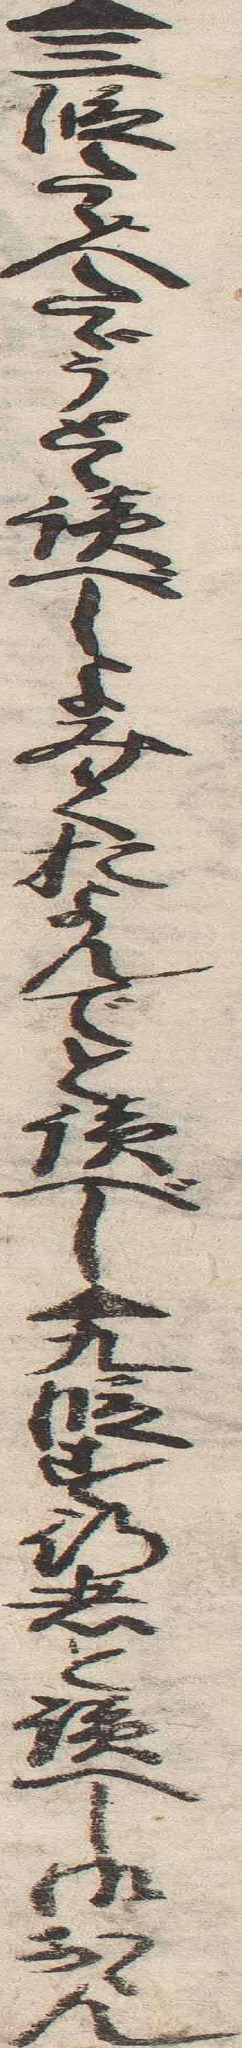▲三段たゞ人たゞうとゝ読べしよみておよんでと読べし▲九段す行者と読へし御おゝん
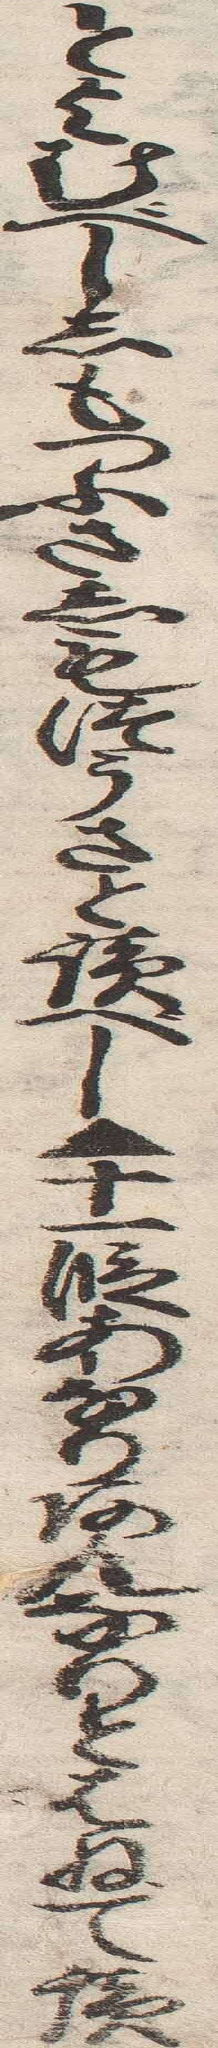とよむべししもつふさしもつうさと読べし▲十一段あなりあんなりとはねて読
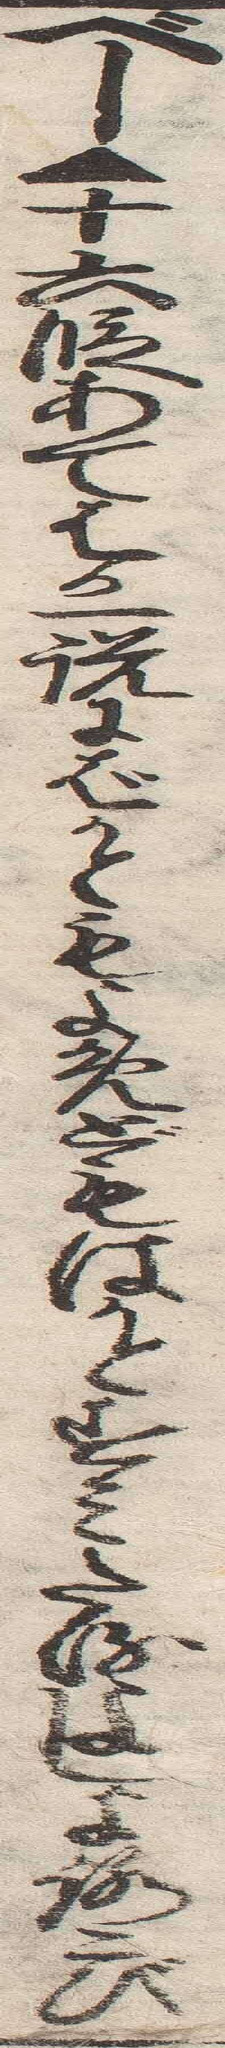べし▲十六段あてはか一説にばかともよめどもはかとすみたるよしよろこび
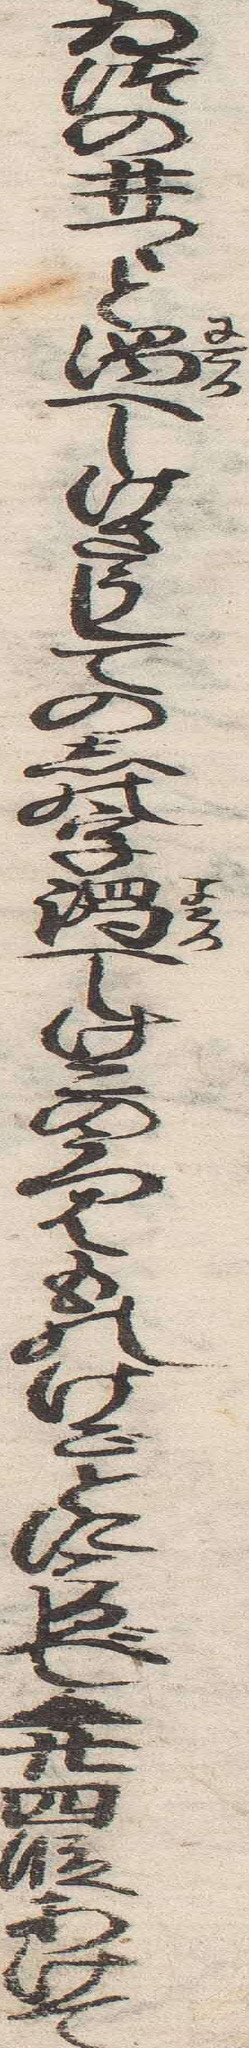ゐづの井つゝと濁へしけさうしてのしの字濁へしけこのうつはものけごとにごるべし▲廿四段あけて
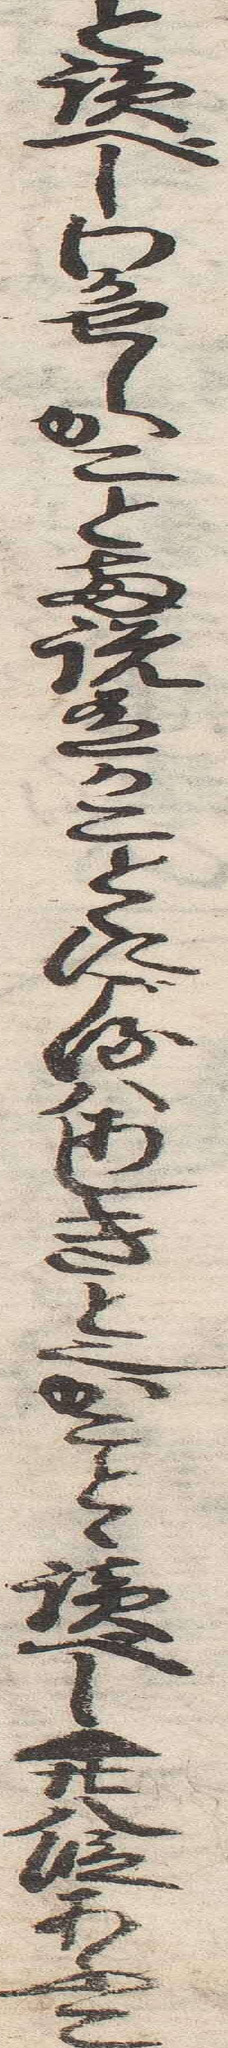と読べしわかせしかこと両説有かことゝにごるはあしきと也かことゝ読べし▼廿八段あふこ
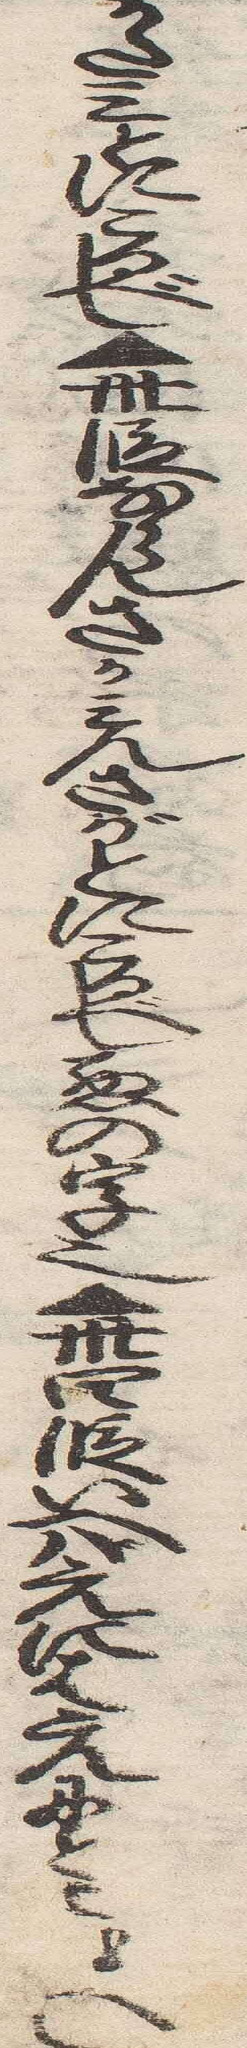かたみとにこるべし▲卅段ならんさかみんさがととにごるべし悪の字なり▲卅四段いへばえにはえにとよむへし
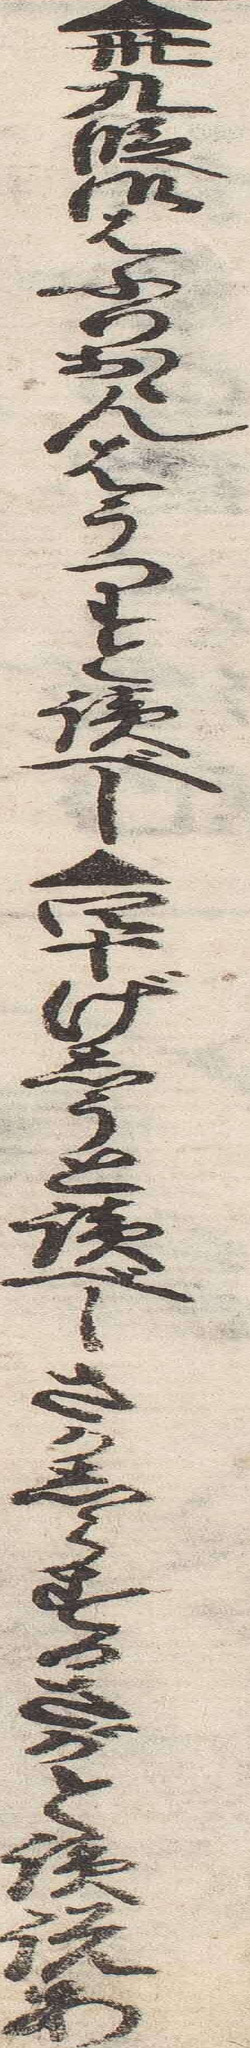▲卅九段御はふりおゝんはうりと読べし▲四十げしうと読べしさかしらするさがと読説あ
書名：伊勢物語
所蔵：東京学芸大学附属図書館 国文学研究資料館
